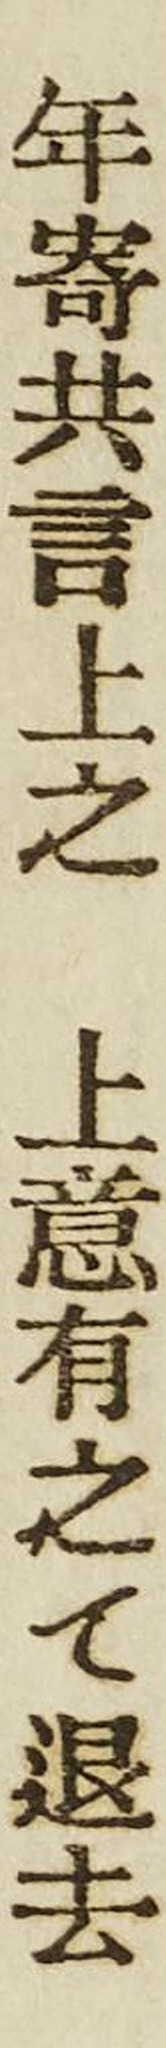年寄共言上之上意有之て退去

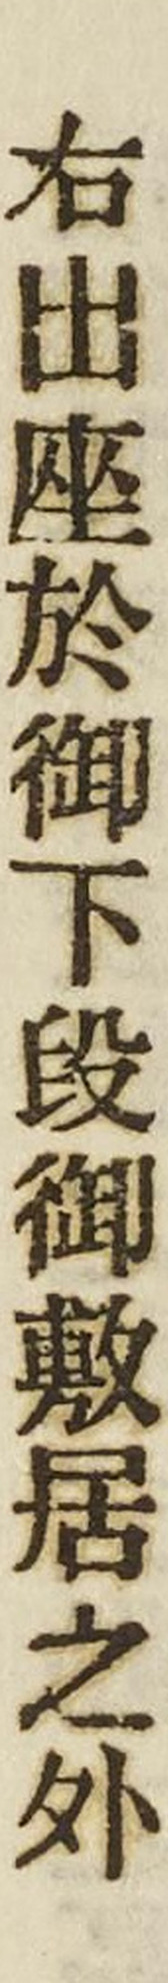右出座於御下段御敷居之外
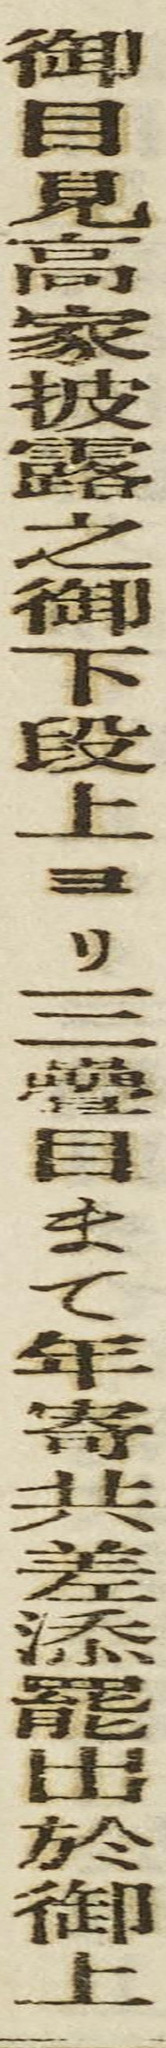御目見高家披露之御下段上ヨリ三畳目まて年寄共差添罷出於御上
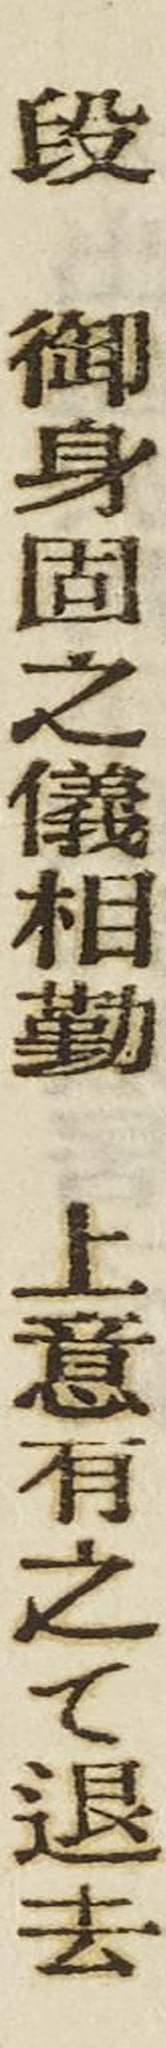段御身固之儀相勤上意有之て退去
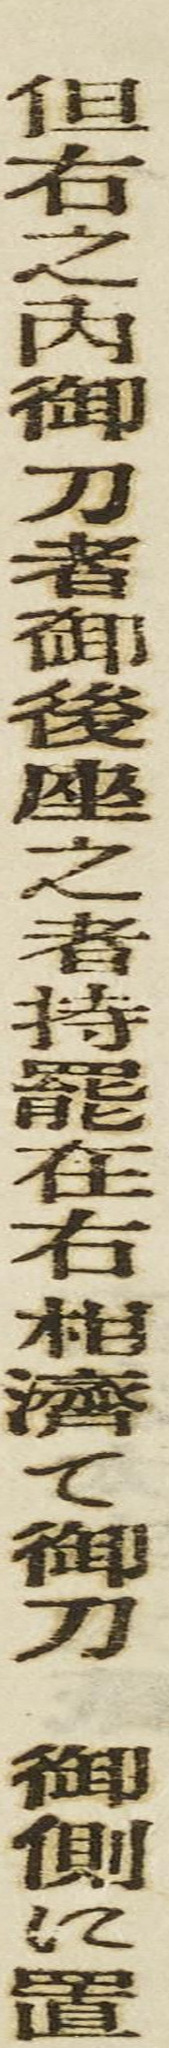但右之内御刀者御後座之者持罷在右相済て御刀御側に置
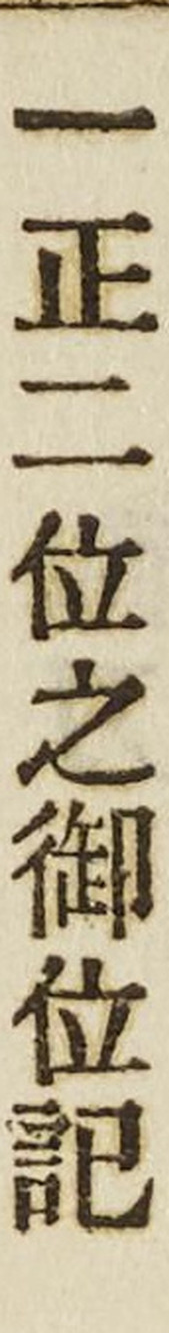一正二位之御位記
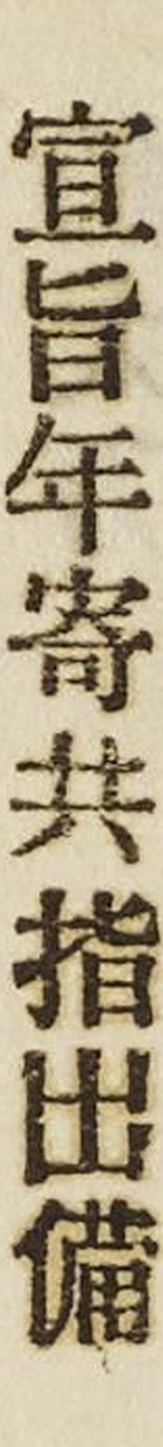宣旨年寄共指出備
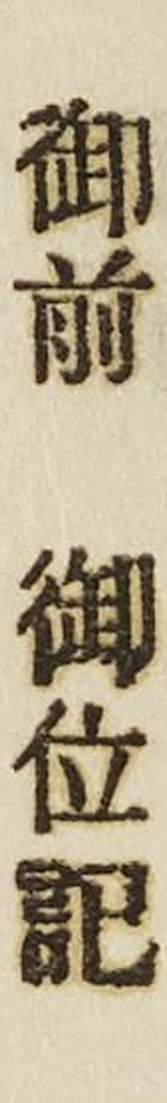御前御位記
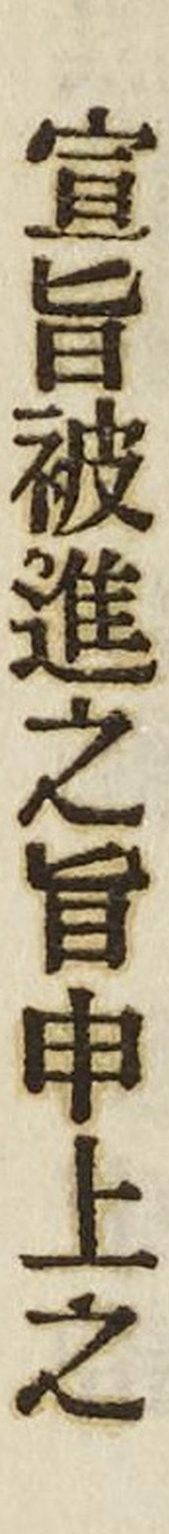宣旨被進之旨申上之
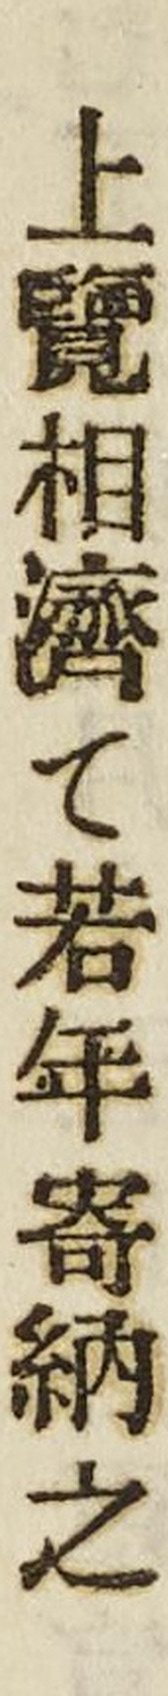上覧相済て若年寄納之
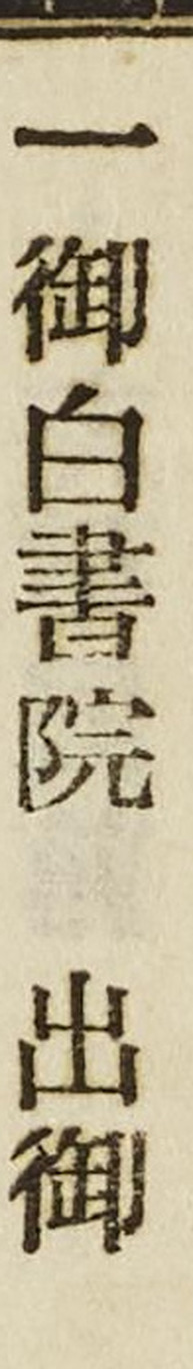一御白書院出御
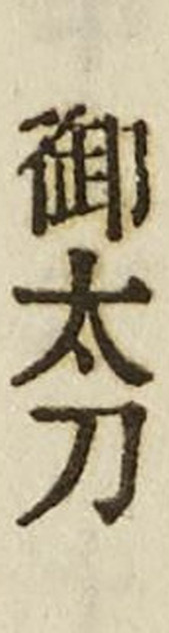御太刀
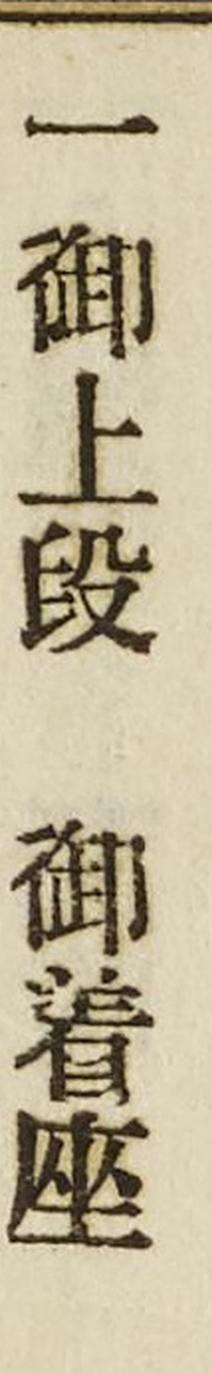一御上段御着座
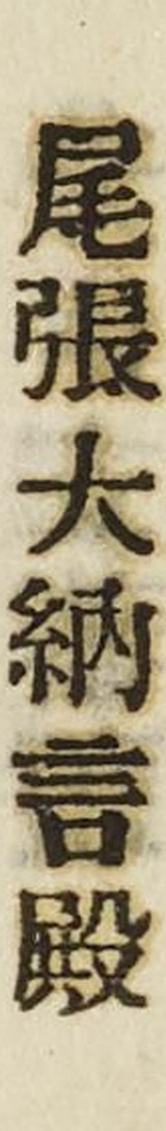尾張大納言殿
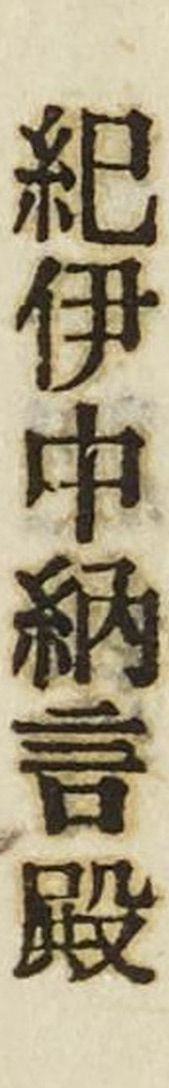煩紀伊中納言殿
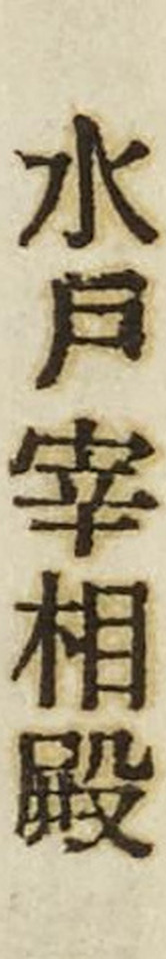水戸宰相殿
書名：史籍集覽　朝鮮陣古文・細井廣澤記・颶風紀事・天明七年將軍宣下次第書　全
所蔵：東京大学地震研究所図書室 Earthquake Research Institute Library, The University of Tokyo, JAPAN
